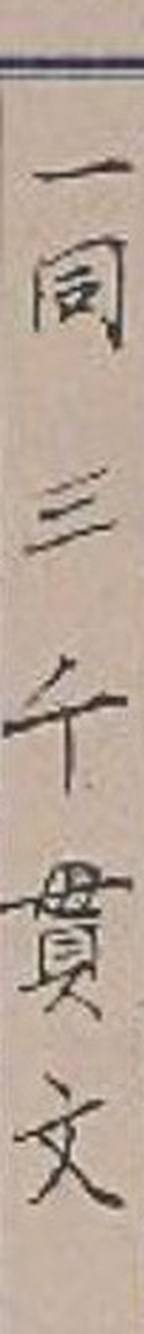一同三千貫文
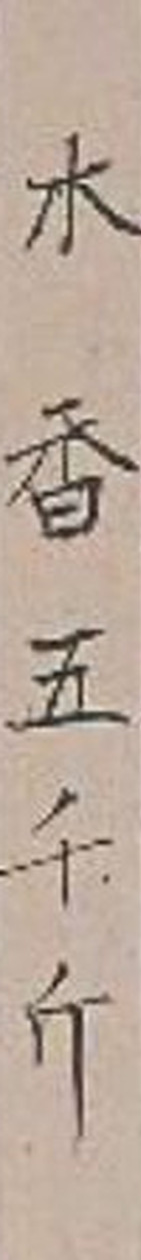木香五千斤
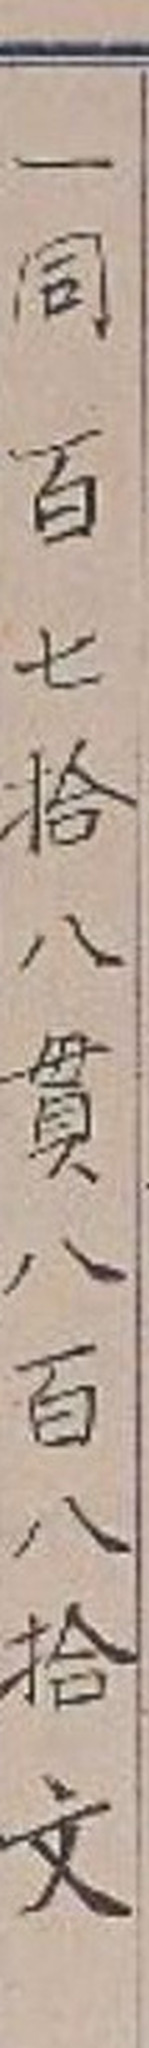一同百七拾八貫八百八拾文
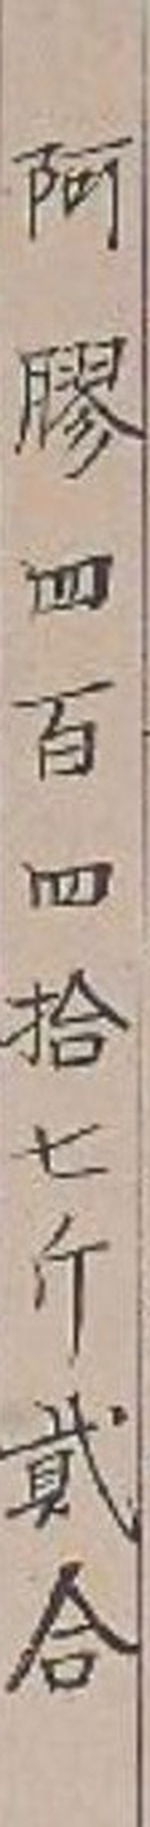阿膠四百四拾七斤貳合
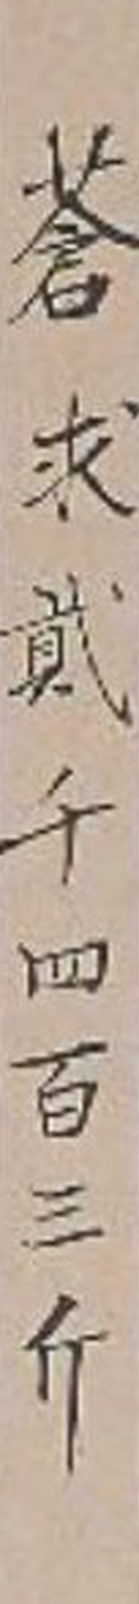蒼求貳千四百三斤
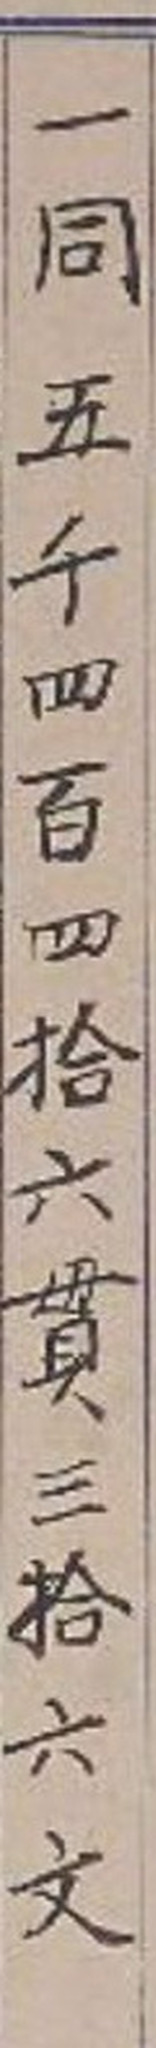一同五千四百六貫三拾六文
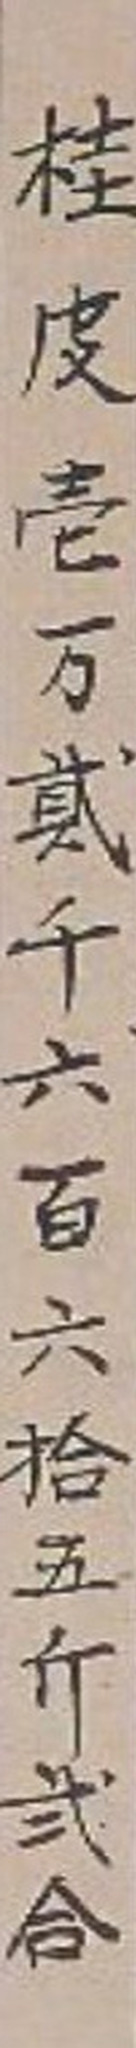桂皮壱万貳千六百六拾五斤弐合
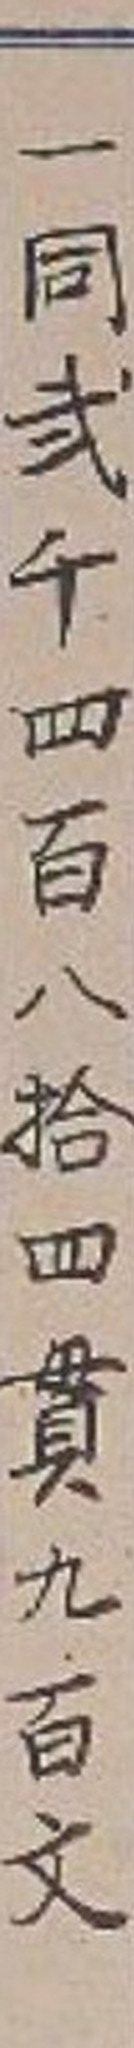一同弐千四百八拾四貫九百文
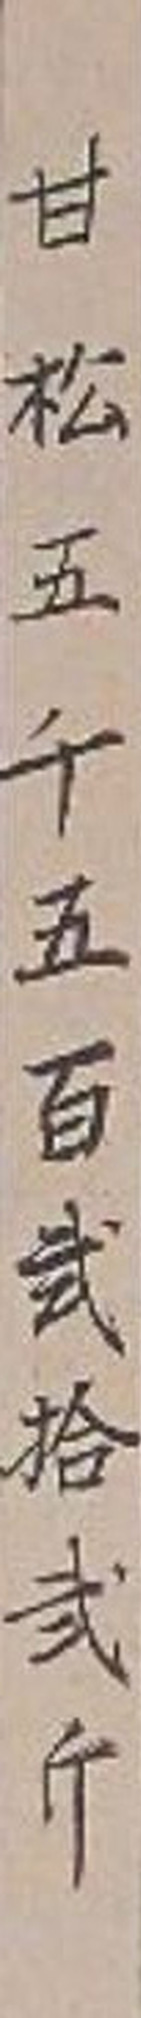甘松五千五百弐拾弐斤
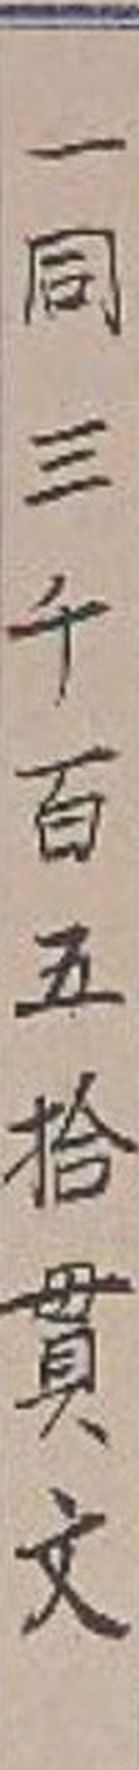一同三千百五拾貫文
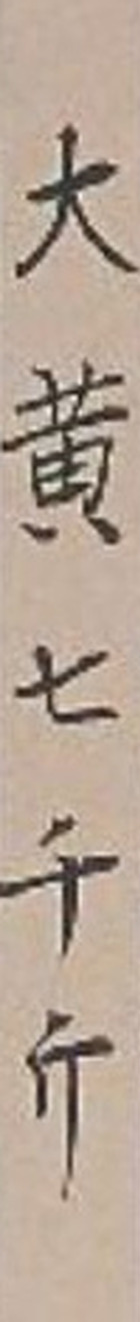大黄七千斤
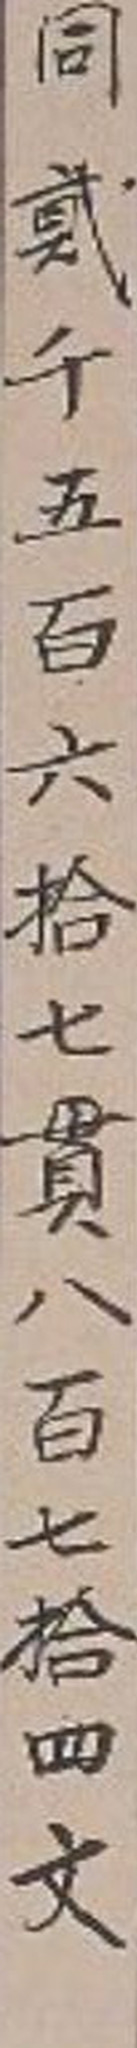一同貳千五百六拾七貫八百七拾四文
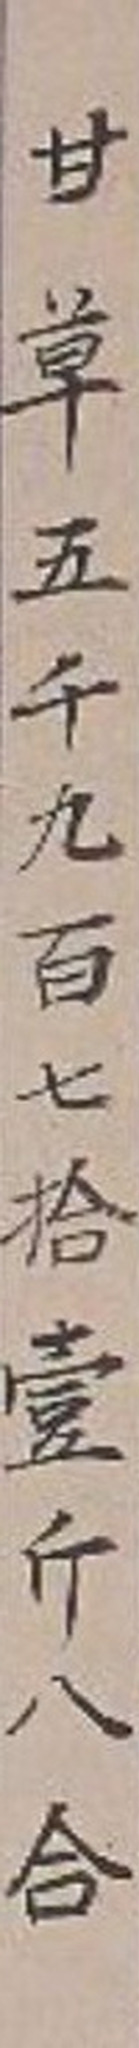甘草五千九百七拾壹斤八合
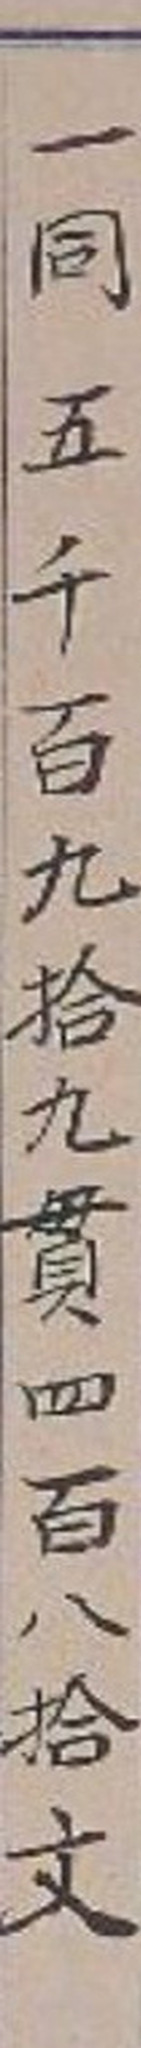一同五千百九拾九貫四百八拾文
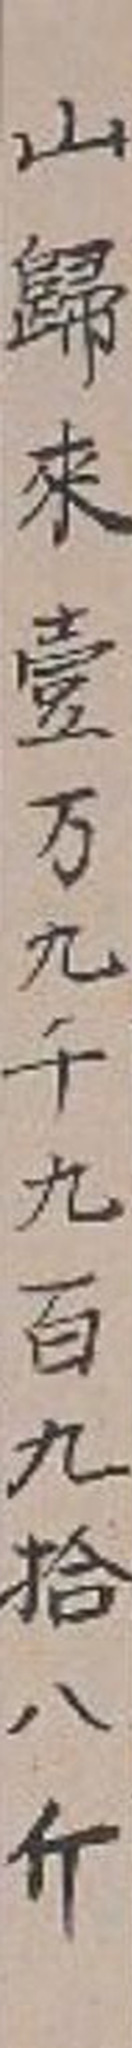山歸來壹万九千九百九拾八斤

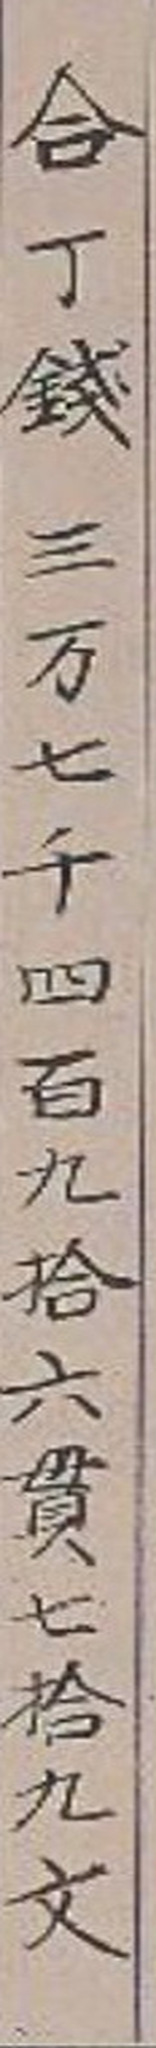合丁錢三万七千四百九拾六貫七拾九文
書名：琉球産物於長崎拂立並本手品利潤総帖 弘化四年より酉年迄
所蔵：University of the Ryukyus Library
